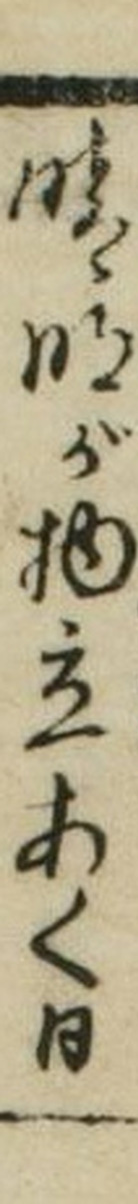晴明が物立あく日
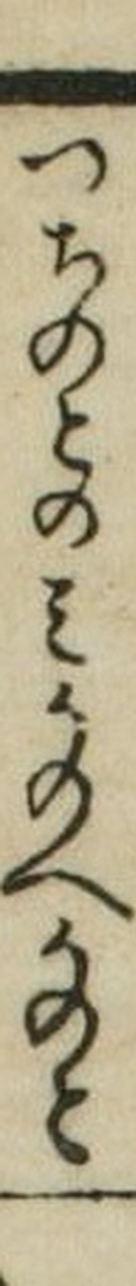つちのとのみかのへかのと
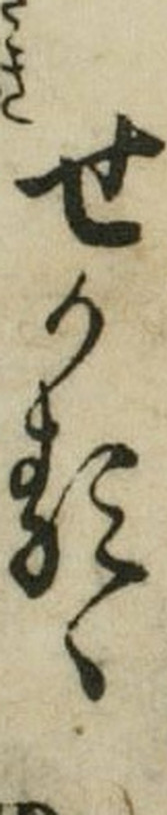せかるゝ
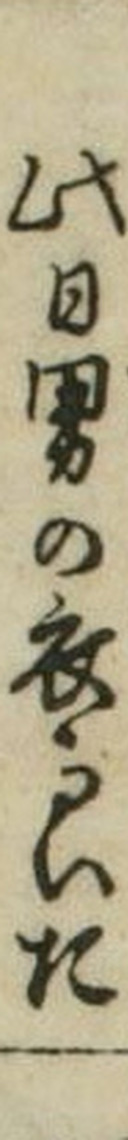此日男の衣るいた
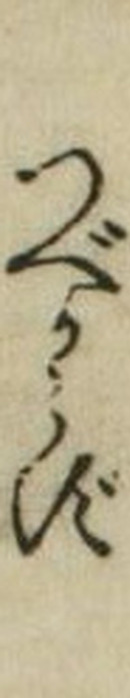つべからず
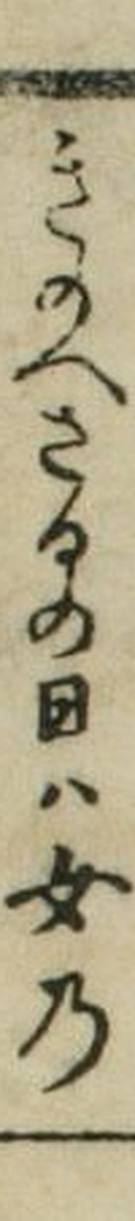きのへさるの日は女の
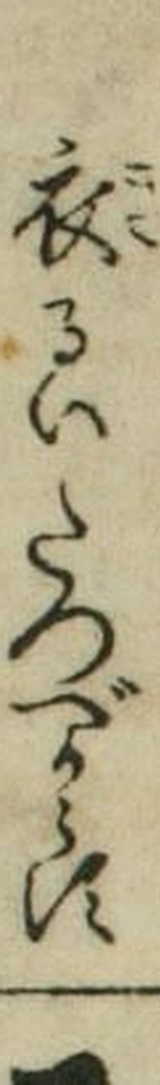衣るいたつべからす
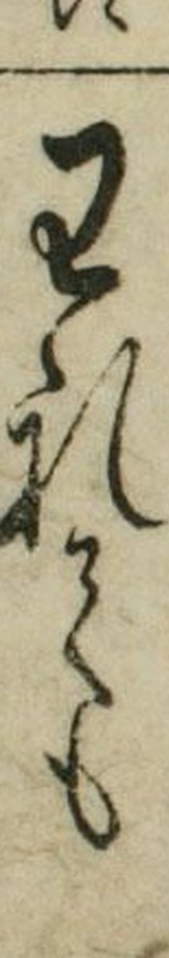われても
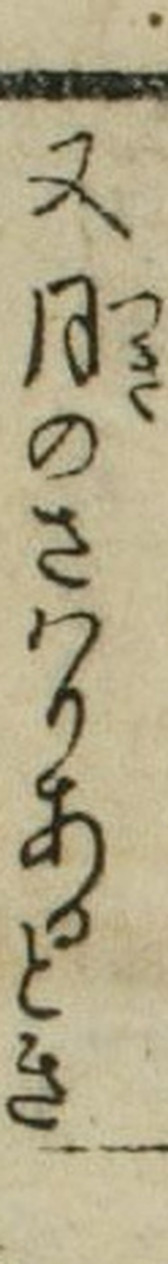又月のさはりあるとき
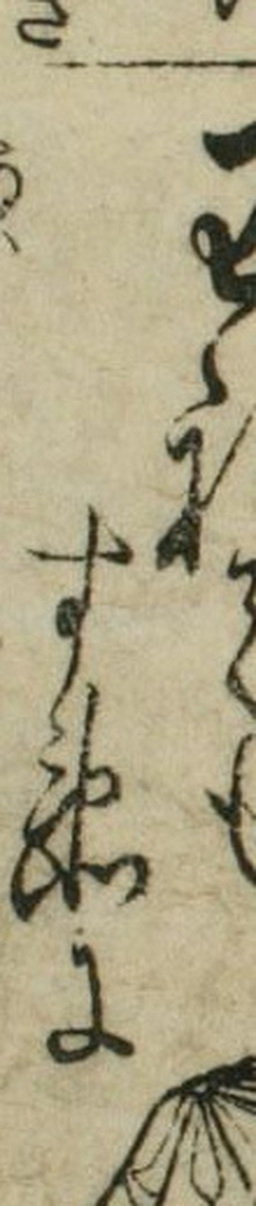すゑに
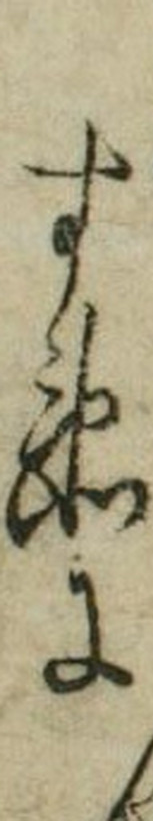すゑに
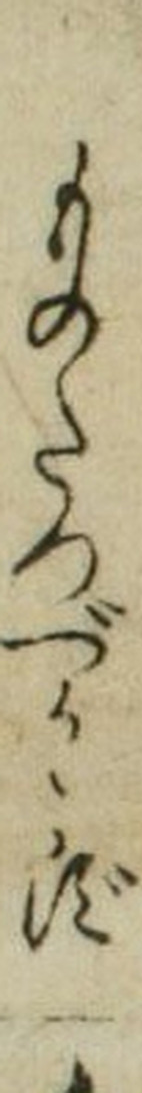ものたつべからず
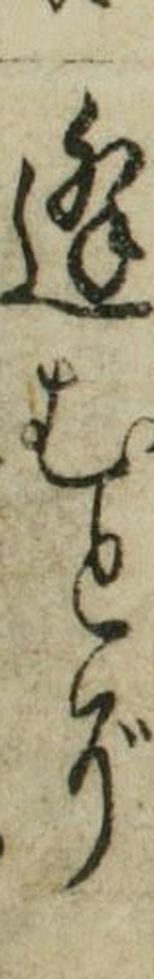逢むとぞ
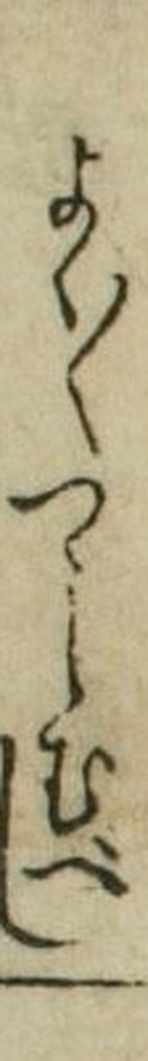よく〳〵つゝしむべし
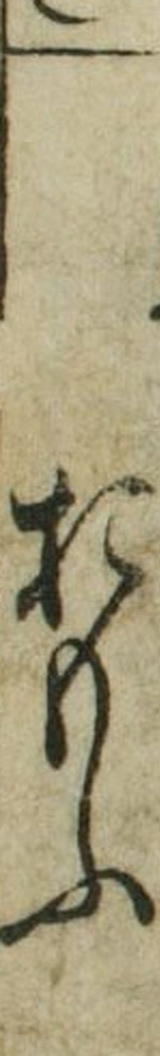おもふ
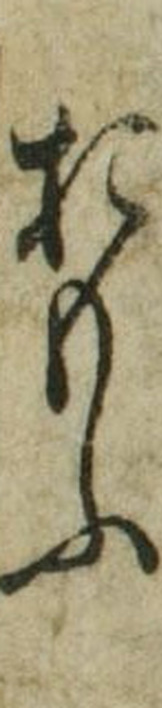おもふ
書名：百人一首
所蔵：東京学芸大学教育コンテンツアーカイブ
